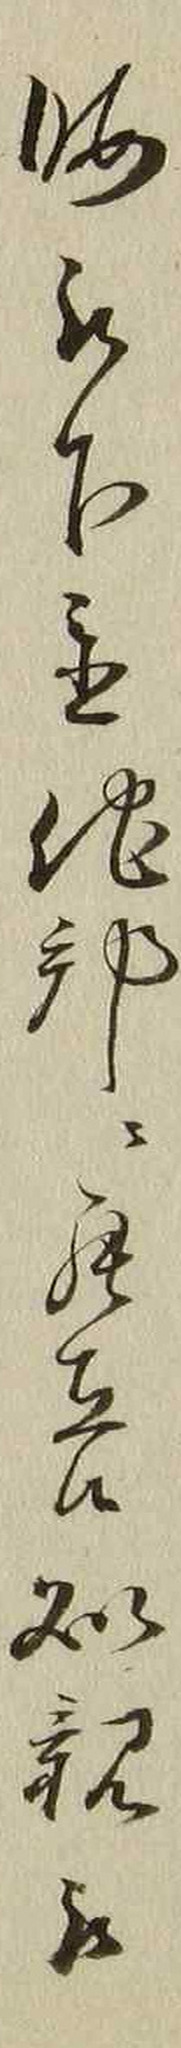暇被下置他邦ニ罷在候処親被
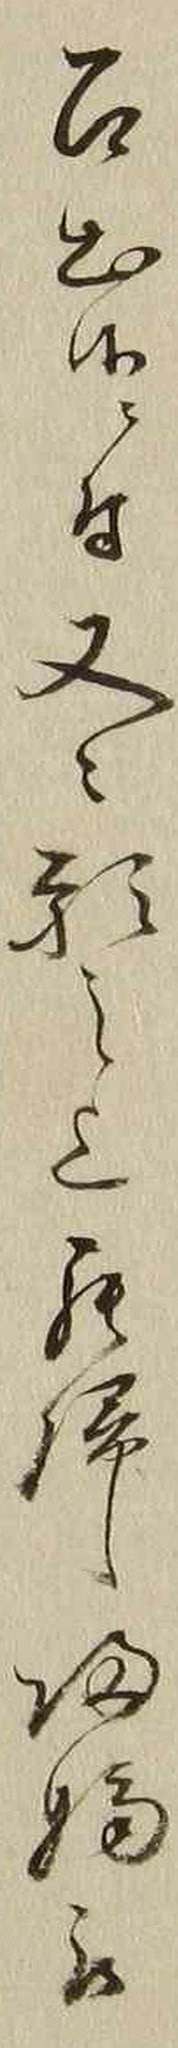召出候ニ付又々願之上罷帰帰嫡被
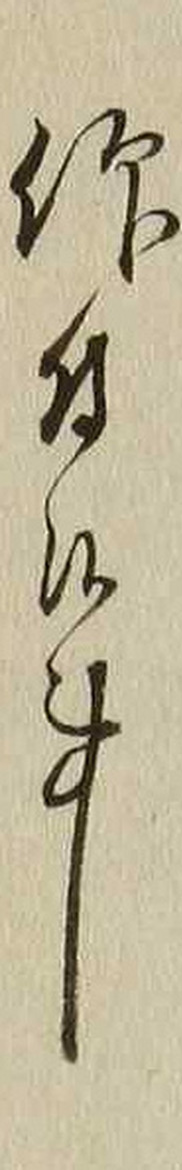仰付候事
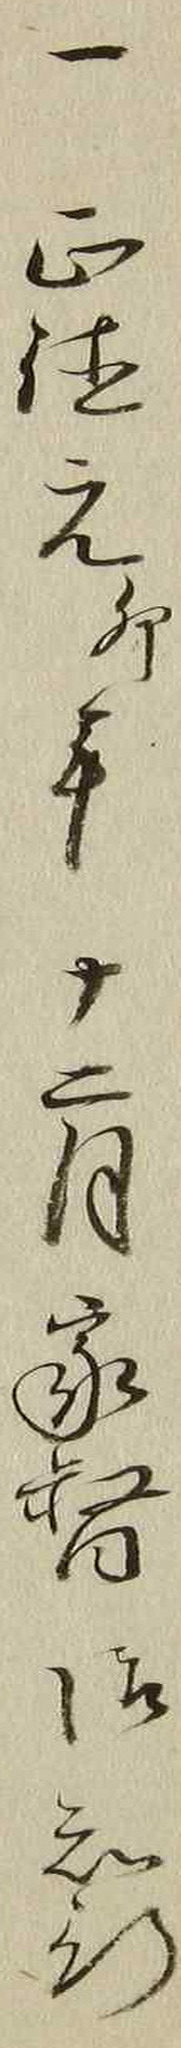一正徳元卯年十二月家督御知行
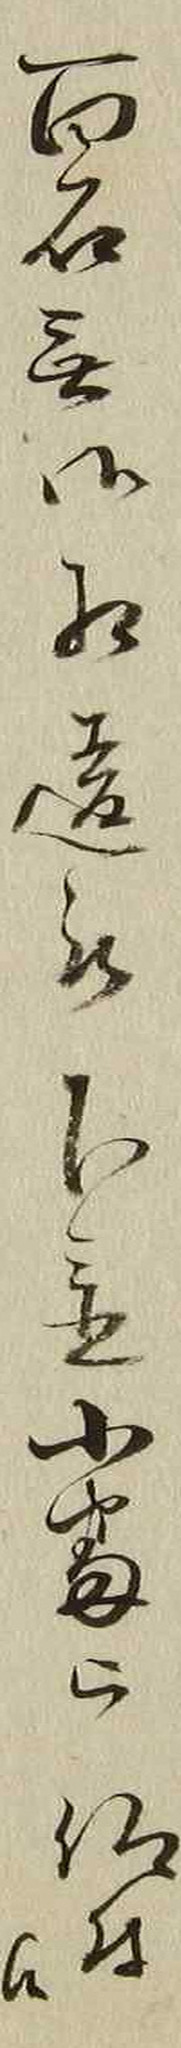百石無御相違被下置小番被仰付候
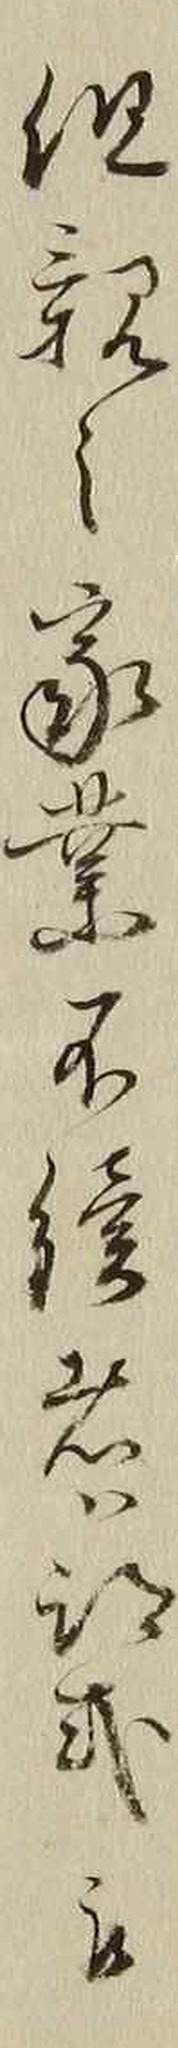但親之家業不続者ハ跡式被
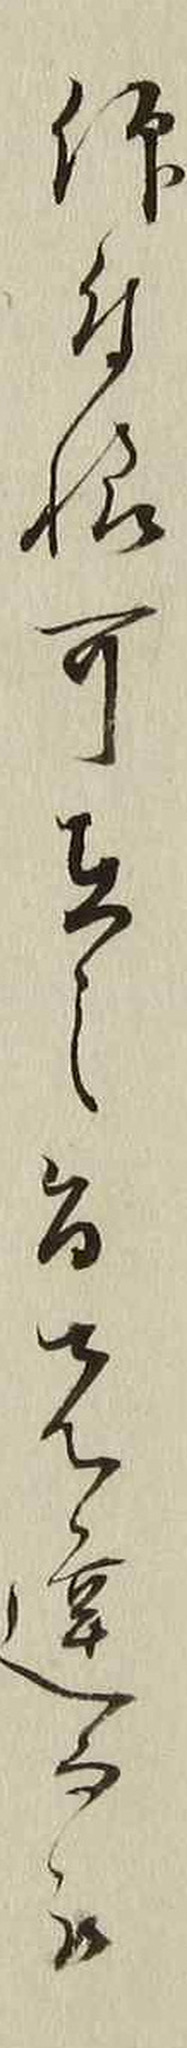仰付様可在之旨先達而被
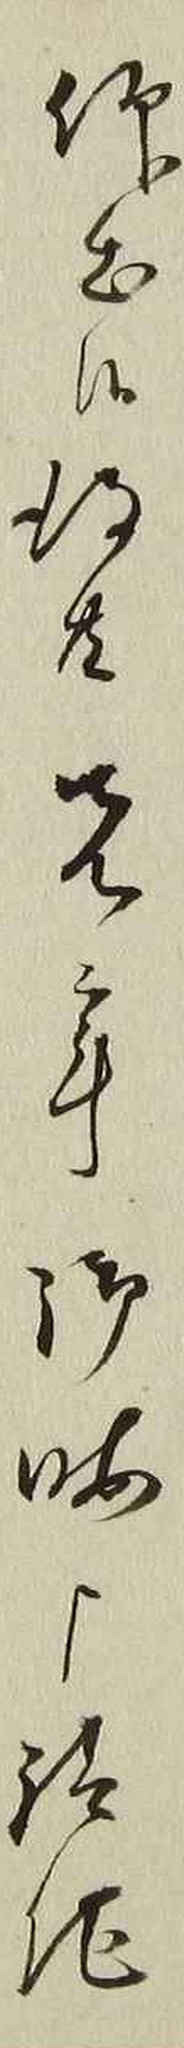仰出候得共先年御暇申請他
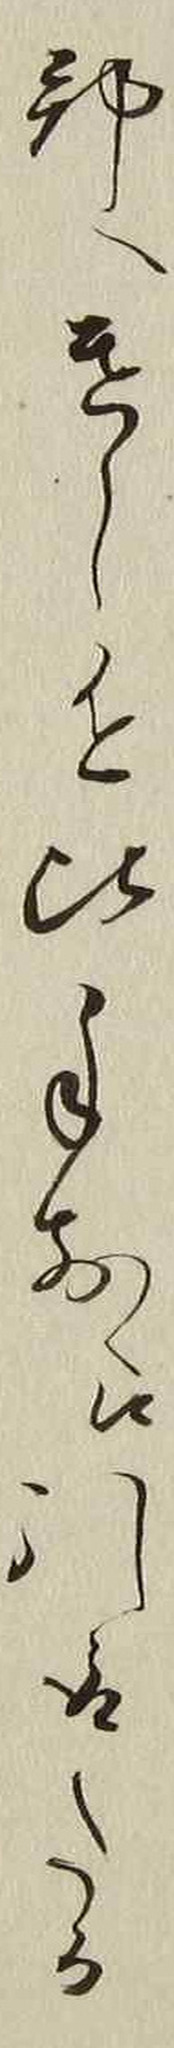邦へ遣し近頃手前江引取たる
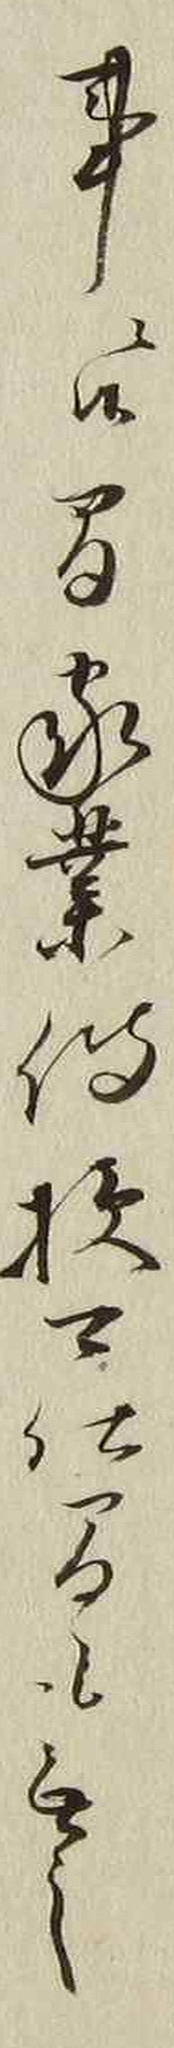事ニ候間家業伝授可仕間も無之
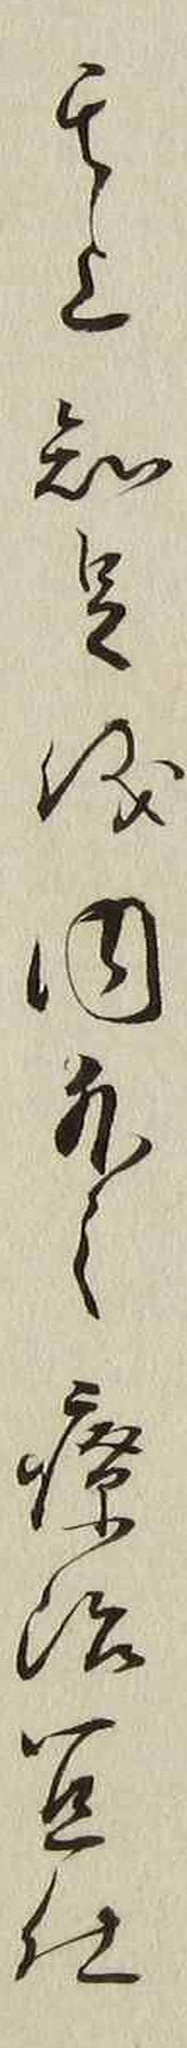其上知足儀内外之療治宜仕
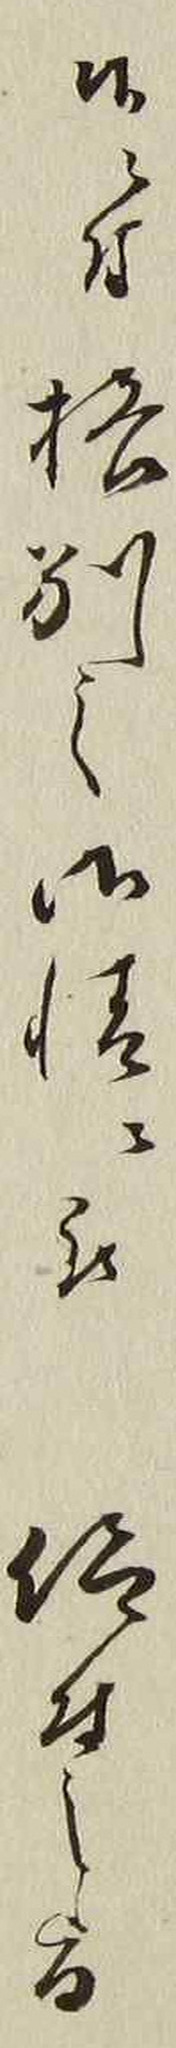候ニ付格別之御情ニ被仰付之旨
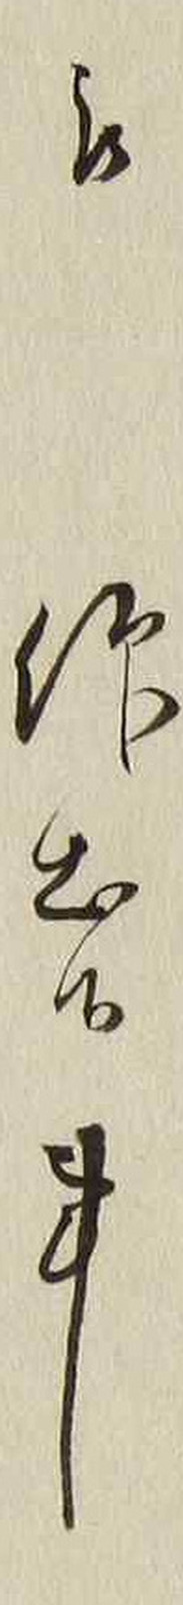被仰出候事
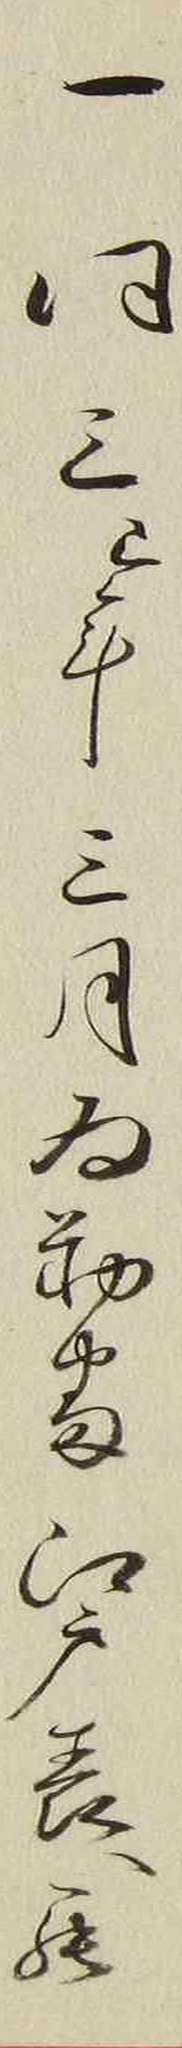一同三巳年三月為勤番江戸表へ罷
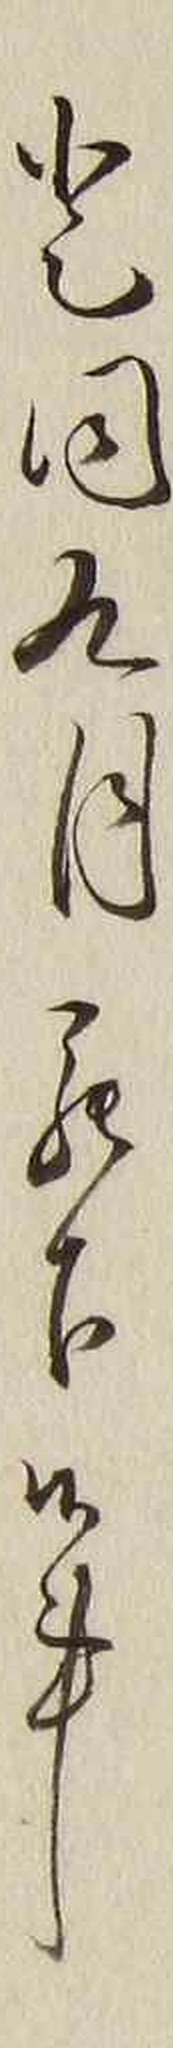登同九月罷下候事
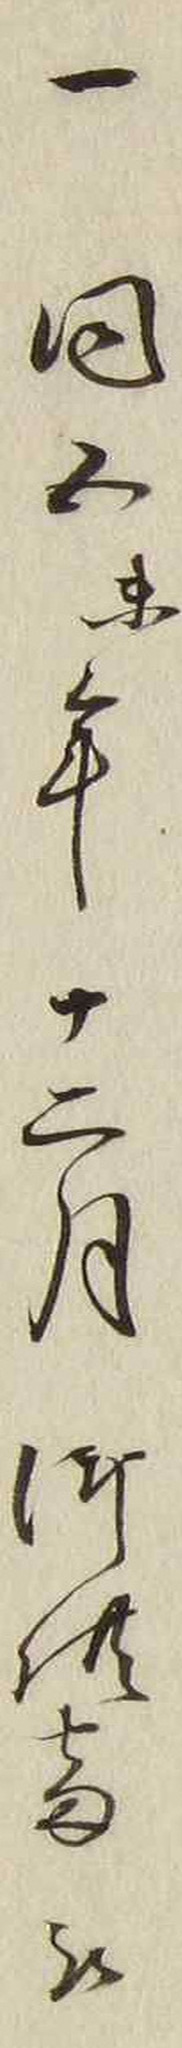一同五未年十二月御供番被
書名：諸士系譜　巻之26　い之部26
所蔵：会津若松市立会津図書館
